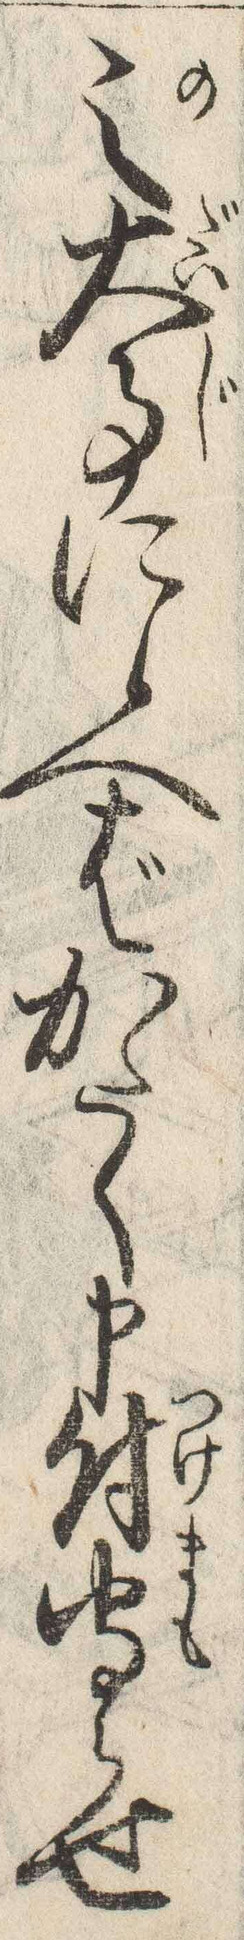之大事に候へばかたく申付守らせ
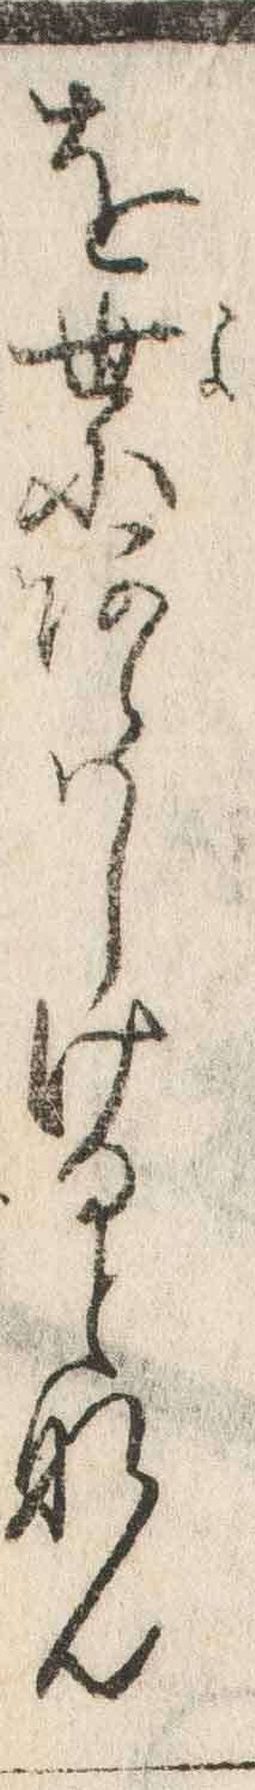を世にあらはしけるとなん
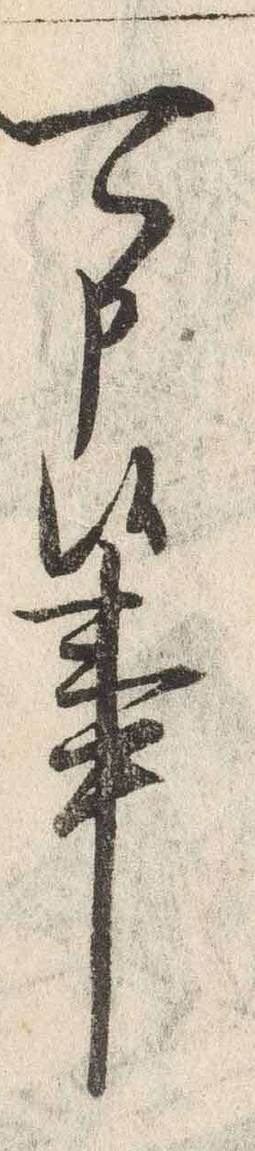可申候事
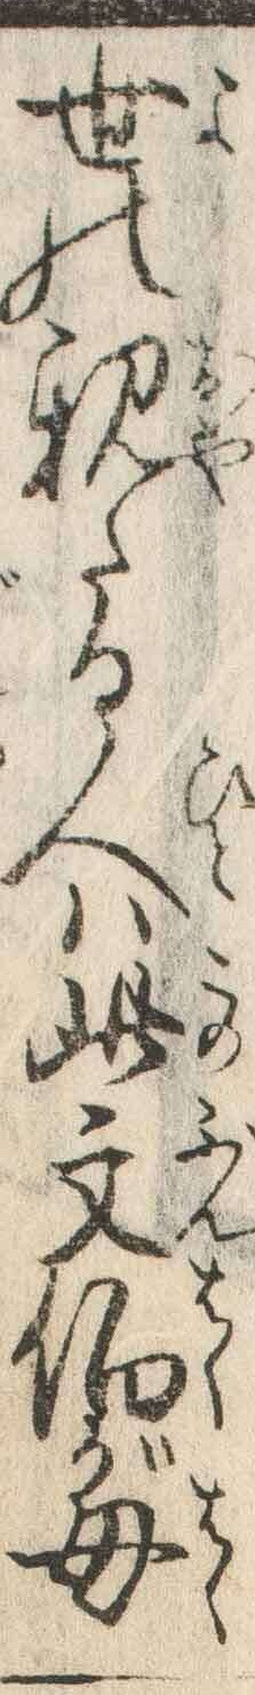世の親たる人は此文伯が母
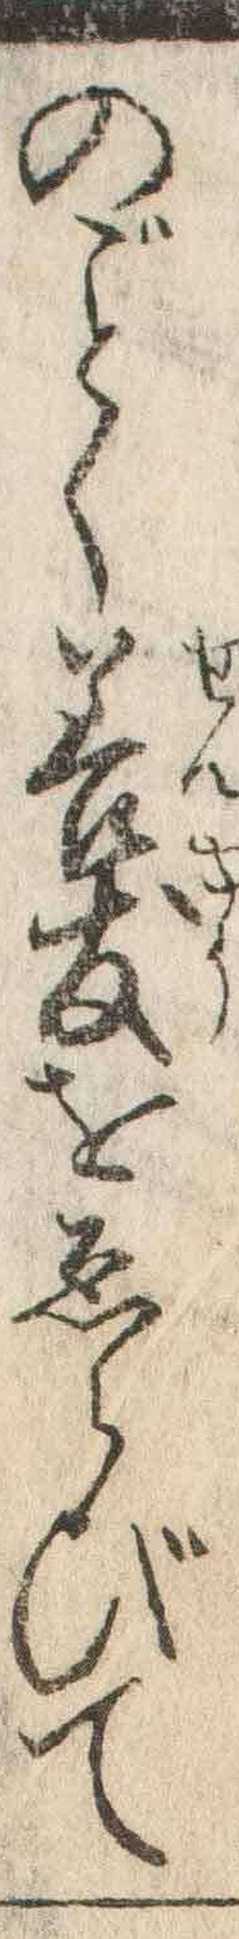のごとく善友をゑらびて
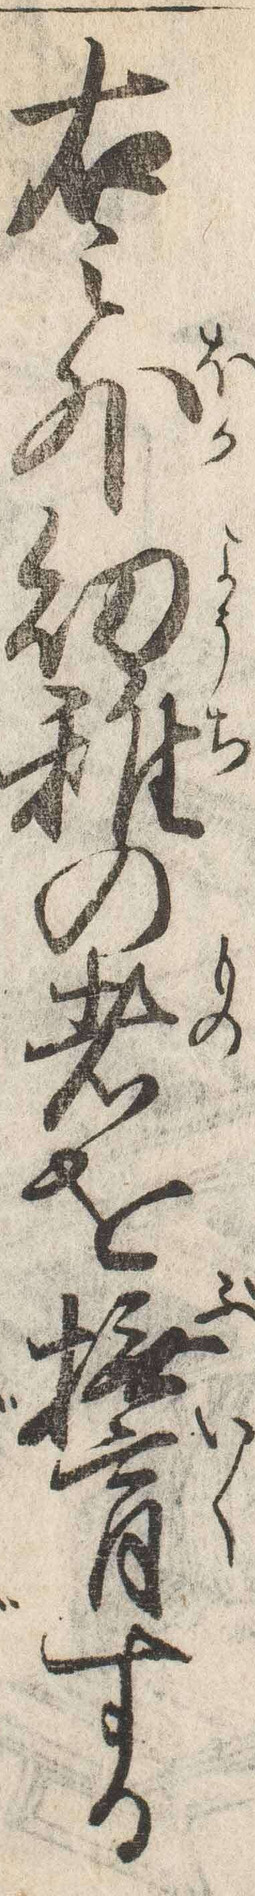右之外幼稚の者を撫育する
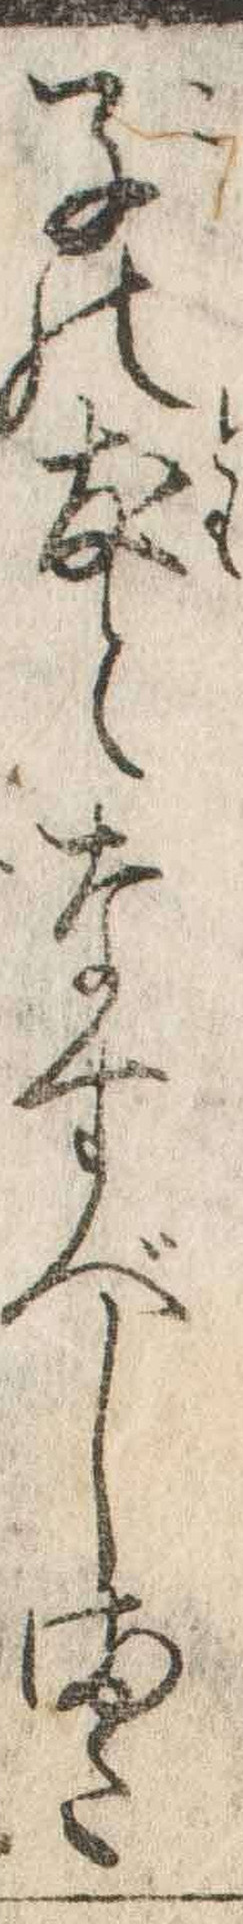子の友となすべしまた
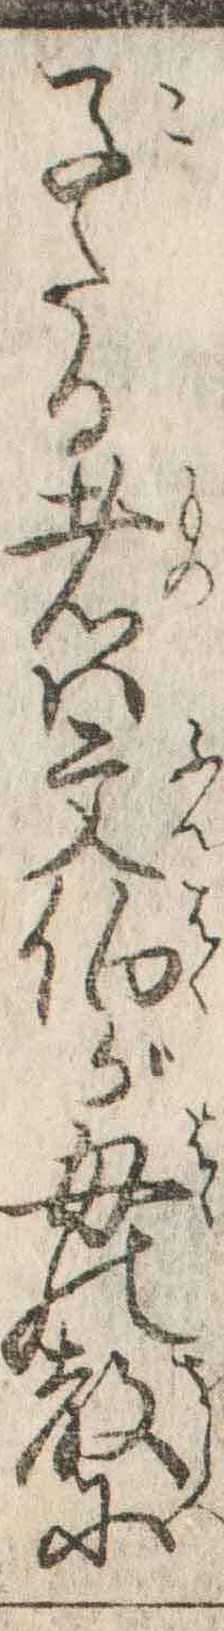子たる者は文伯が母の教に
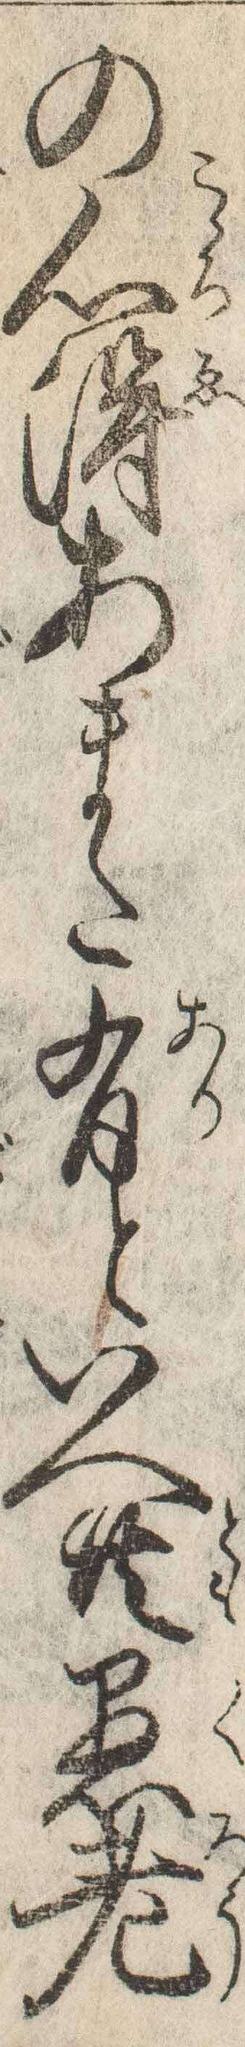の心得あまた有といへ共愚老
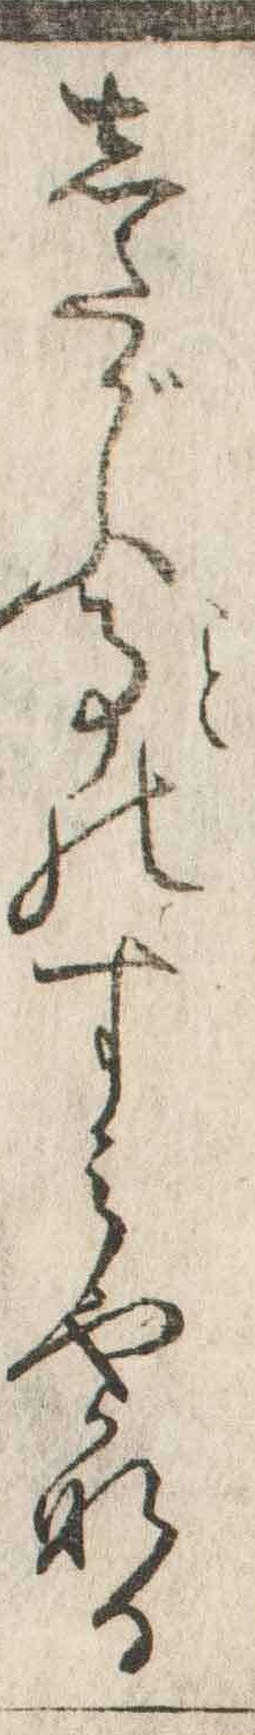したがふ事のすみやかなる
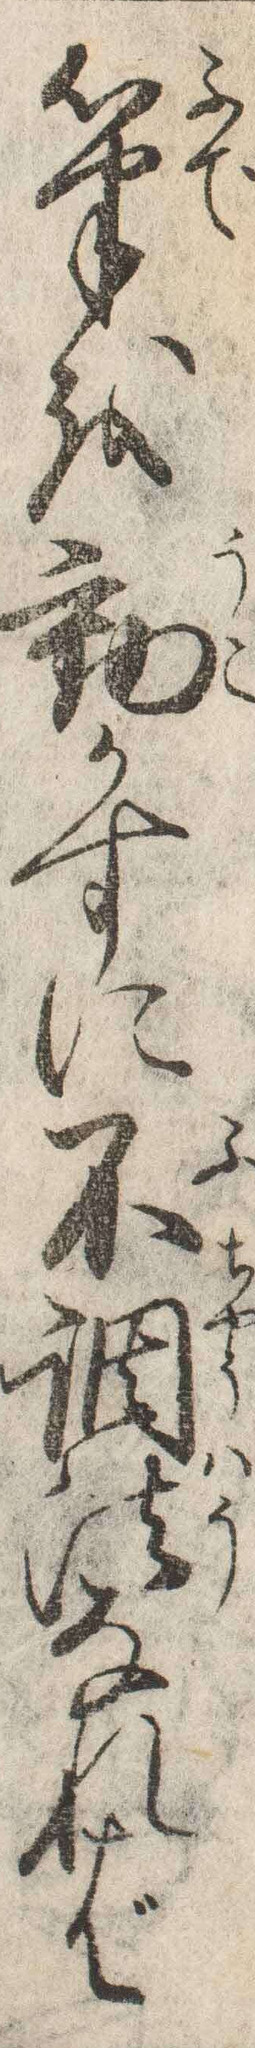筆を動かすに不調法なれば
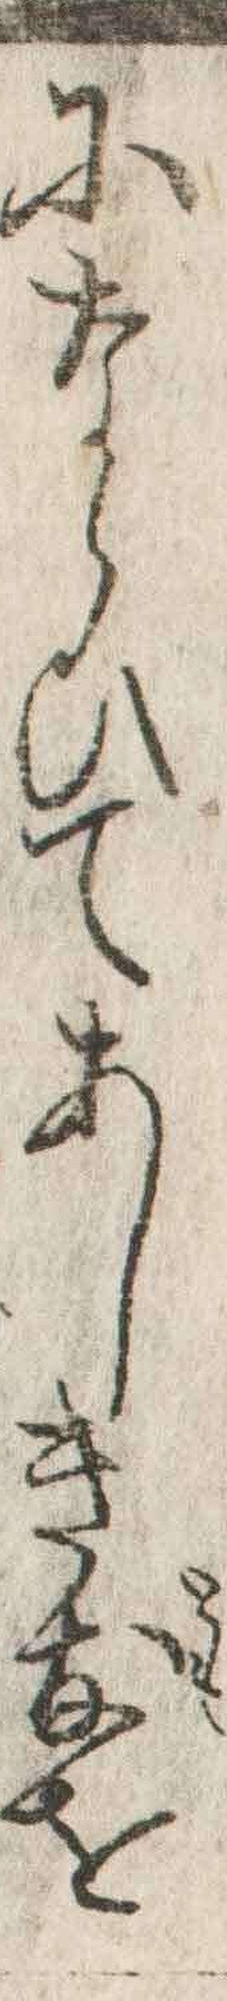にならひてあしき友を
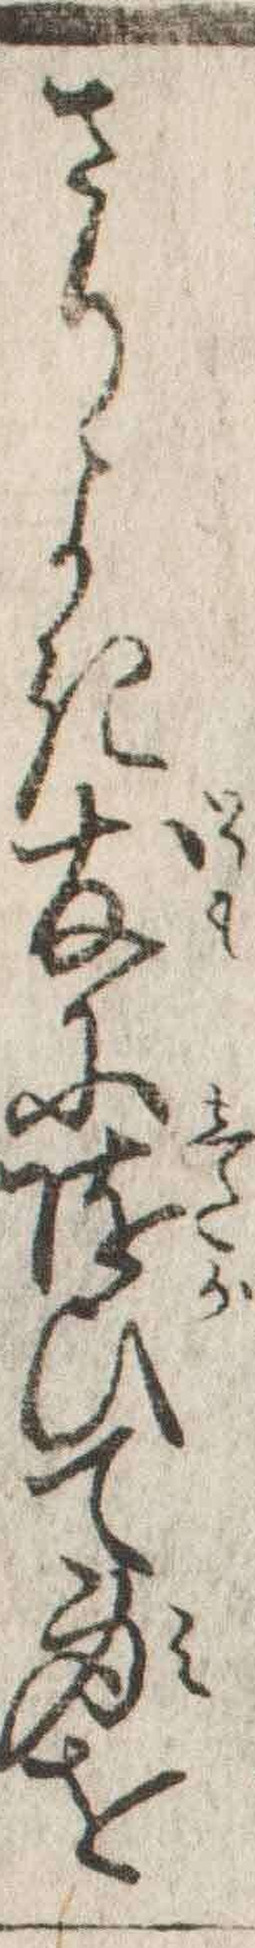さりよき友に随ひて身を
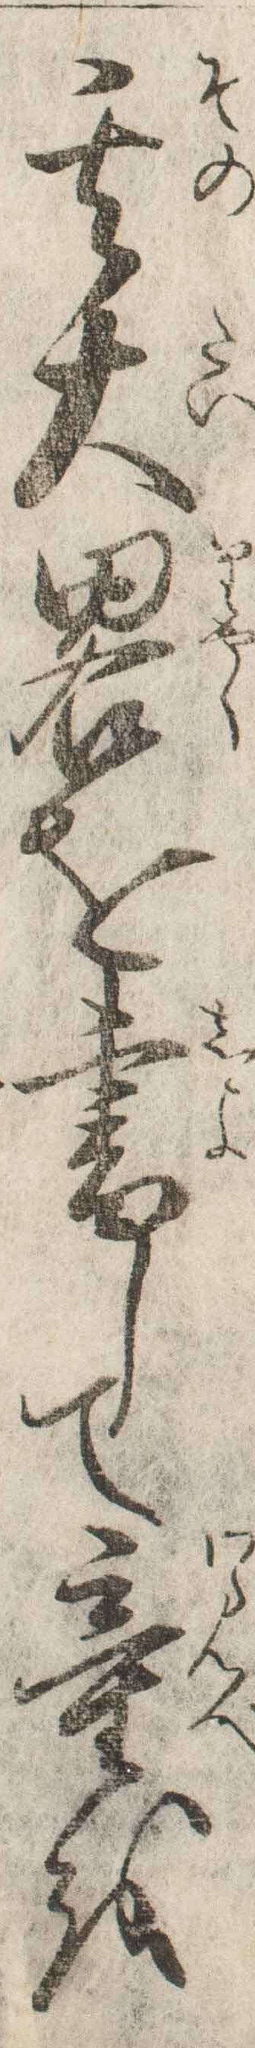其大略を書して童を
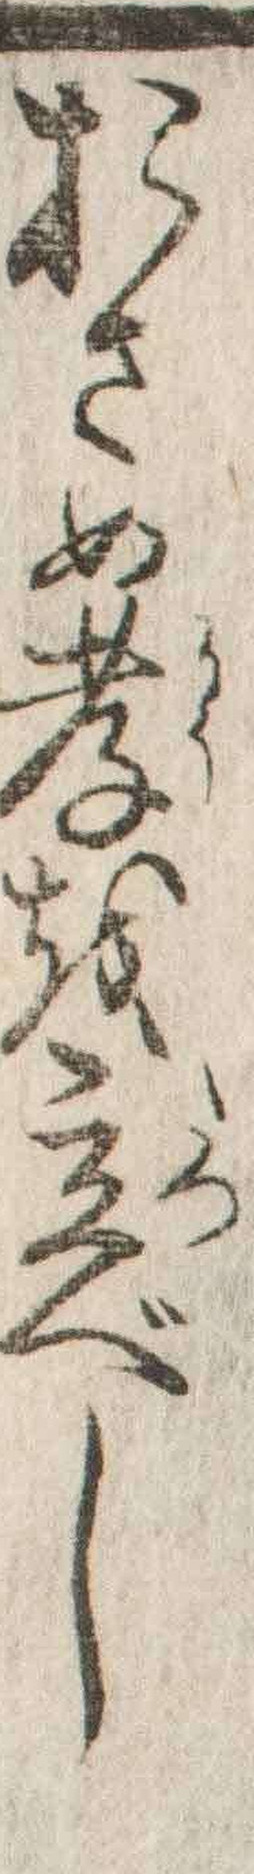おさめ孝を立べし
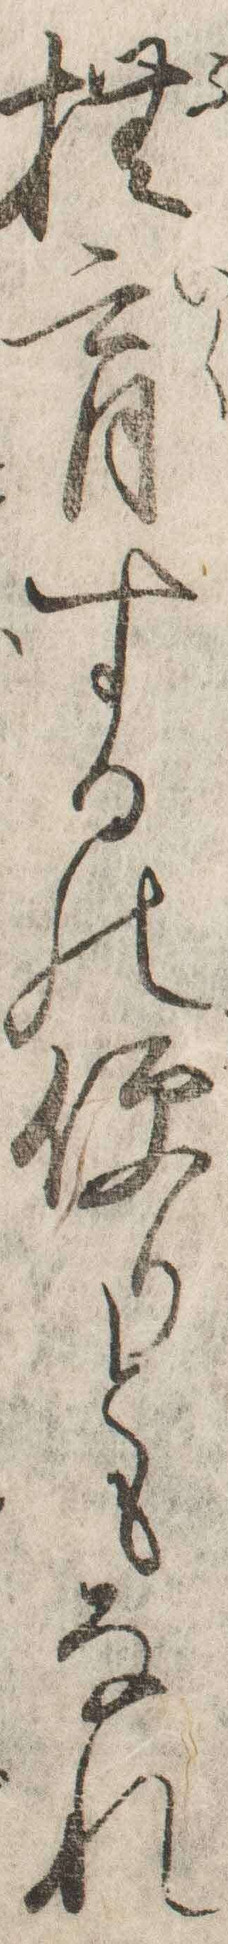撫育するの便りともなれ
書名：撫育草
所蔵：東京学芸大学附属図書館 国文学研究資料館
